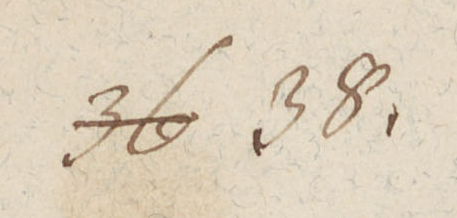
36 38.
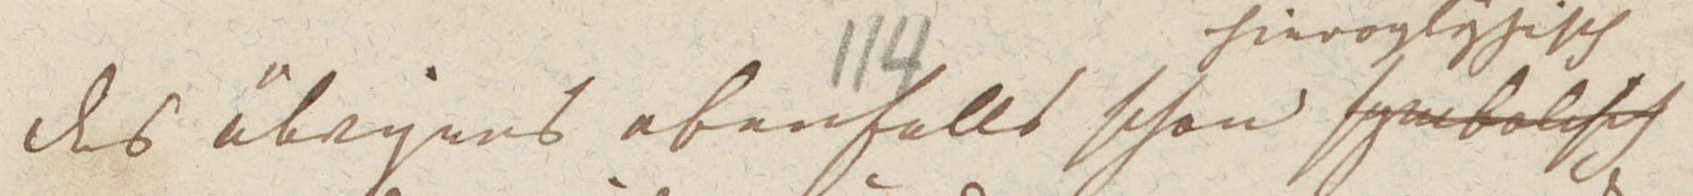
das übrigens ebenfalls schon symbolisch
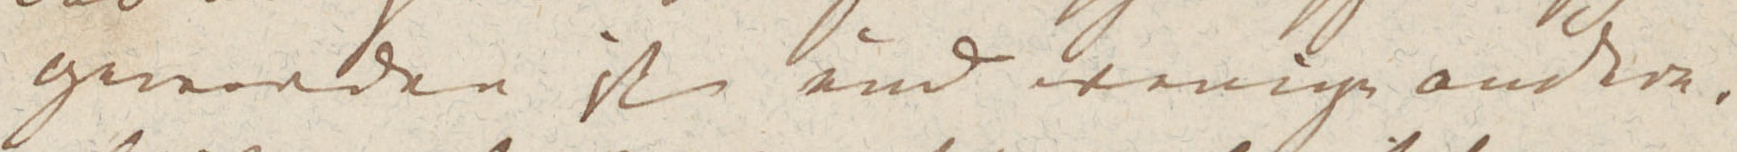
geworden ist und wenige andere.
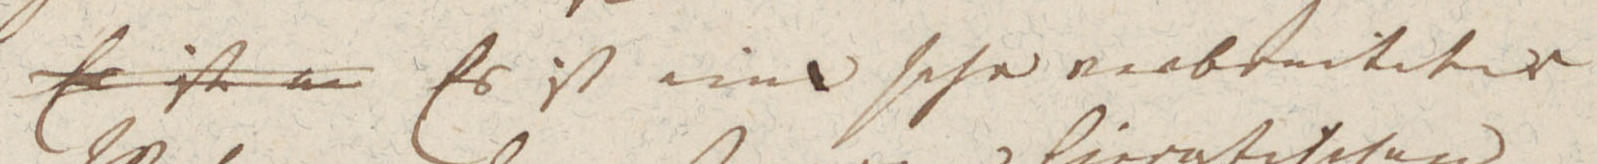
Es ist ei Es ist eine sehr verbreiteter
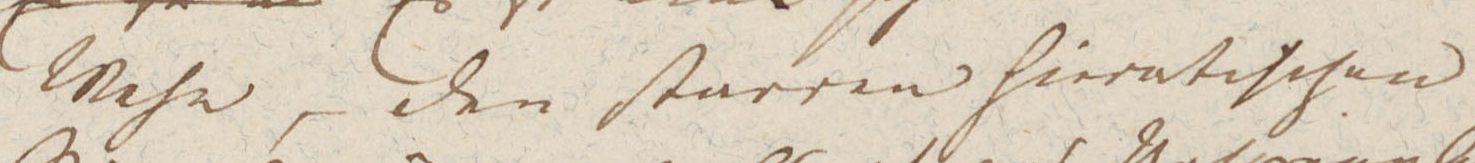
Wahn, den starren hieratischen
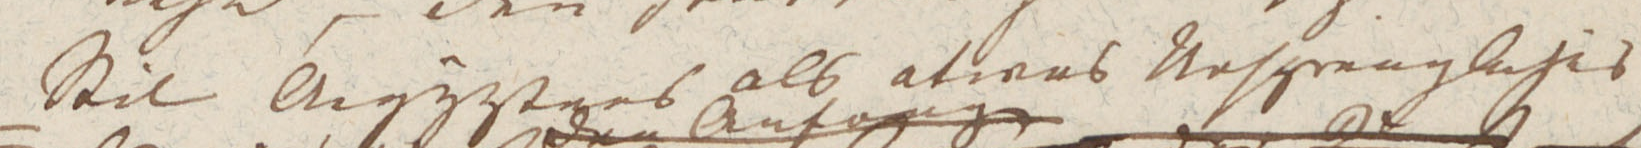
Stil Aegyptens als etwas Ursprüngliches
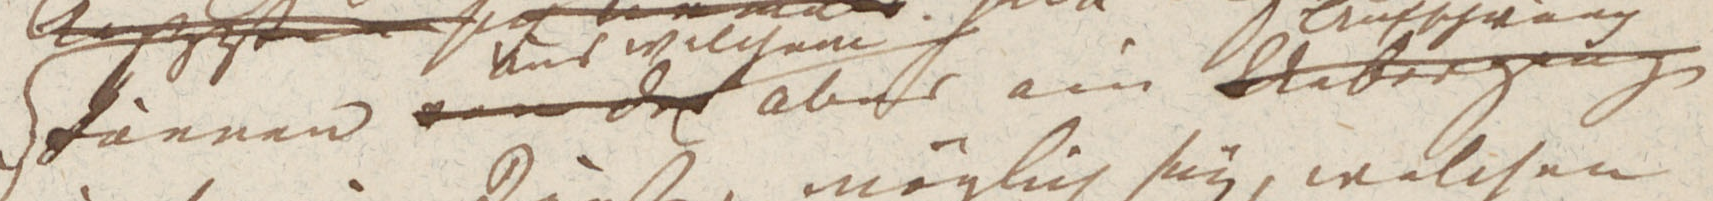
können von der aus welchem aber ein Uebergang
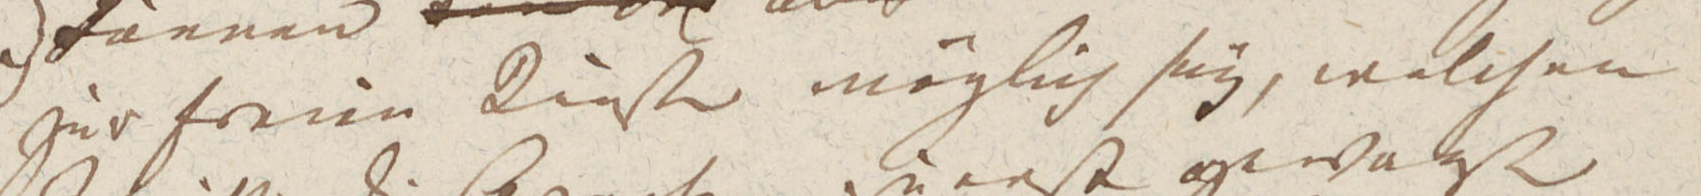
zur freien Kunst möglich sey, welchen
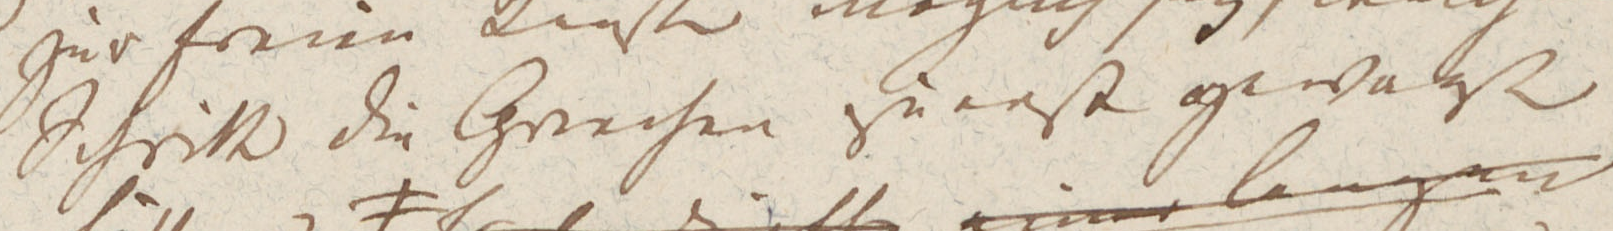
Schritt die Griechen zuerst gewagt
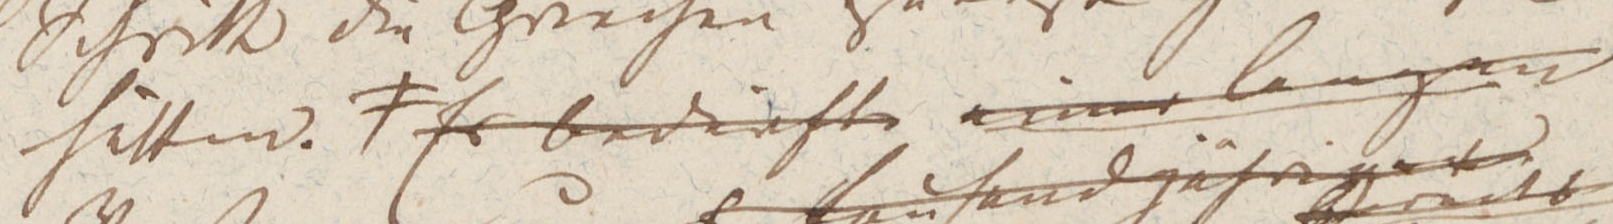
hätten. % Es bedurfte einer langen
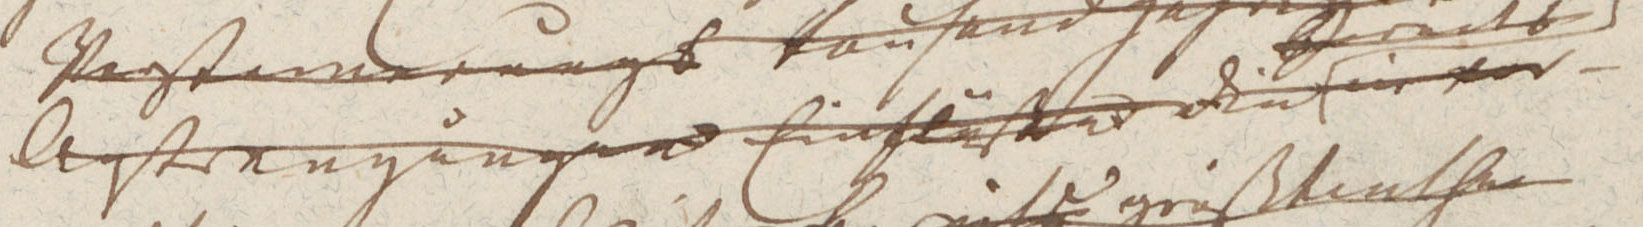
Anstrengungen Einflüsse die bereits in vor-
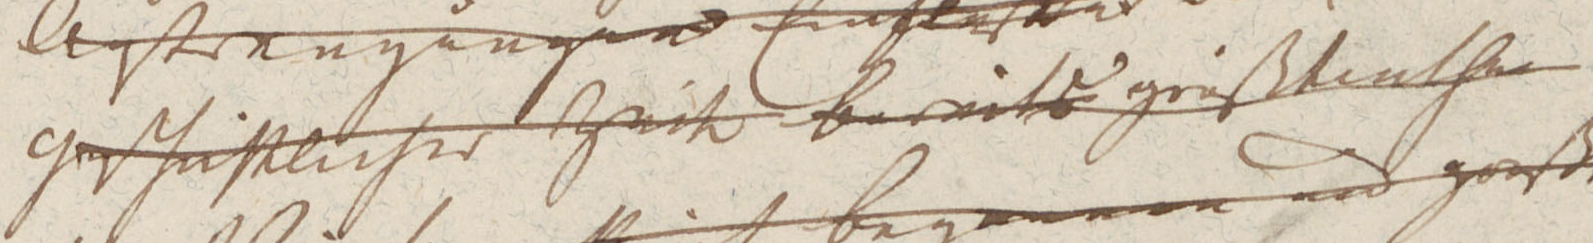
geschichtlicher Zeit bereits grösstenthei
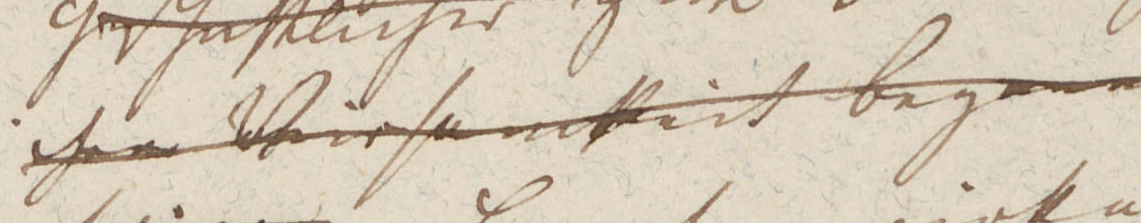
ihre wWirksamkeit geannen und
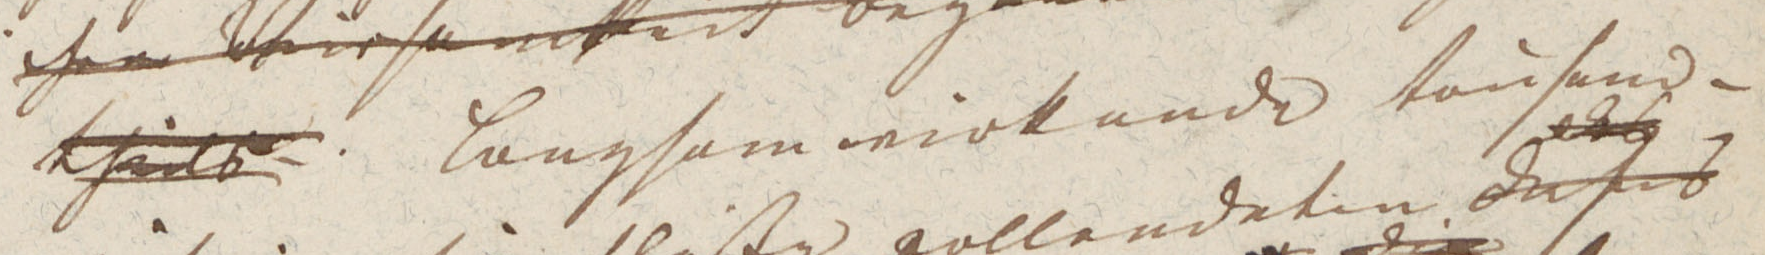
theils langsam wirkende tausend-
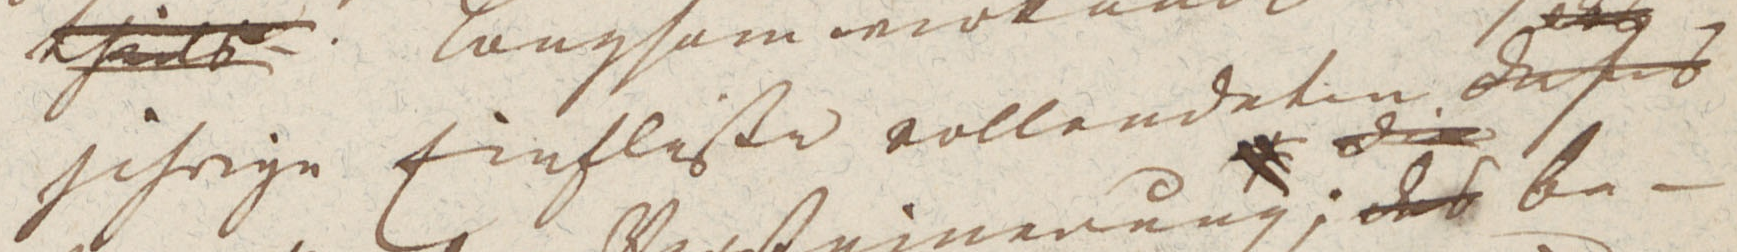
jihrige Einflüsse vollendeten dieses
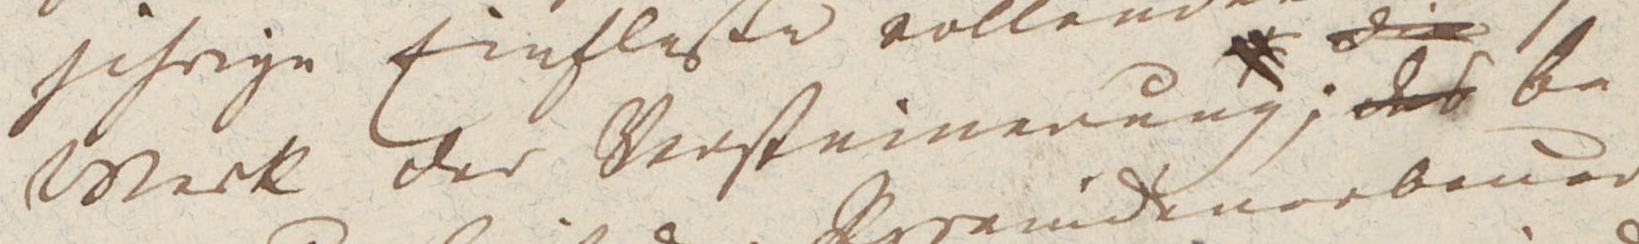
Werk der Versteinerung %; das die
